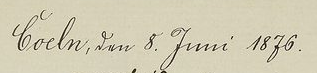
Coeln, den 8. Juni 1876
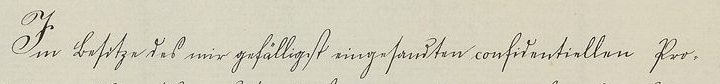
Im Besitze des mir gefälligst eingesandten confidentiellen Pro-
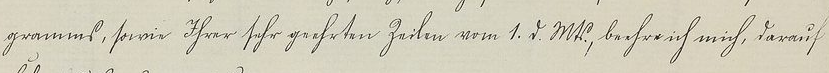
gramms, sowie Ihrer sehr geehrten Zeilen vom 1.d. Mts. , beehre ich mich, darauf
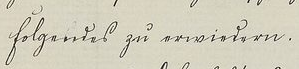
folgendes zu erwiedern.
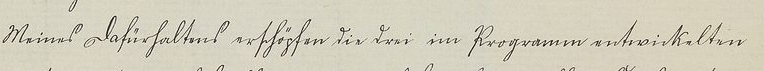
Meines Dafürhaltens erschöpfen die drei im Programm entwickelten
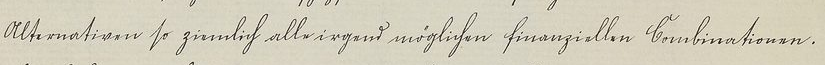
Alternativen so ziemlich alle irgend möglichen finanziellen Combinationen.
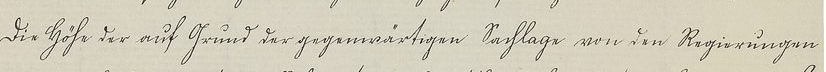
Die Höhe der auf Grund der gegenwärtigen Sachlage von den Regierungen
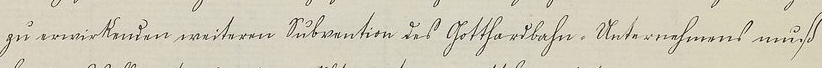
zu erwirkenden weiteren Subvention des Gotthardbahn-Unternehmens muß
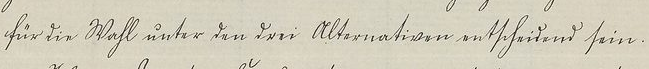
für die Wahl unter den drei Alternativen entscheidend sein.
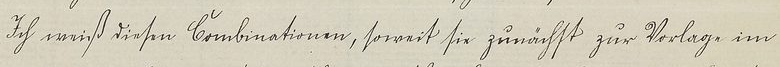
Ich weiß diesen Combinationen, soweit sie zunächst zur Vorlage im
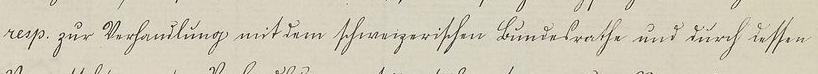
resp. zur Verhandlung mit dem schweizerischen Bundesrathe und durch dessen
